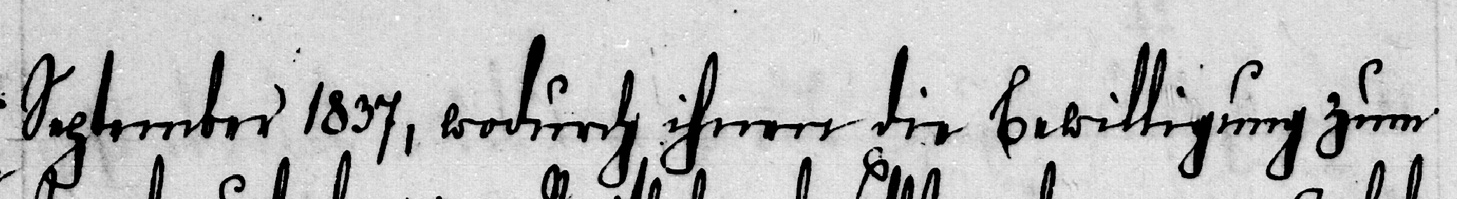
September 1837, wodurch ihnen die Bewilligung zum
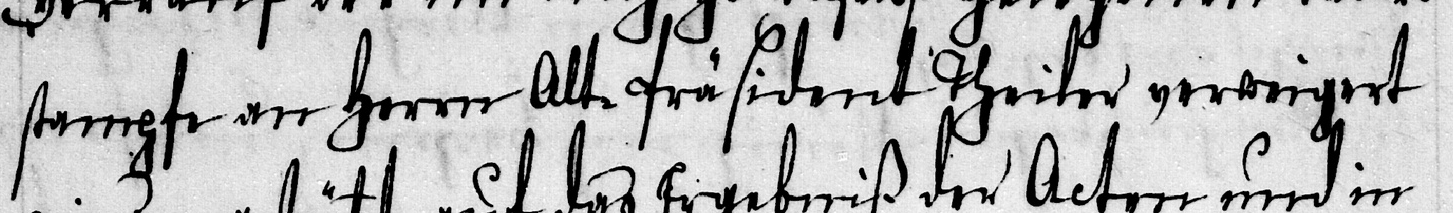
stampfe an Herrn Alt-Präsident Theiler verweigert
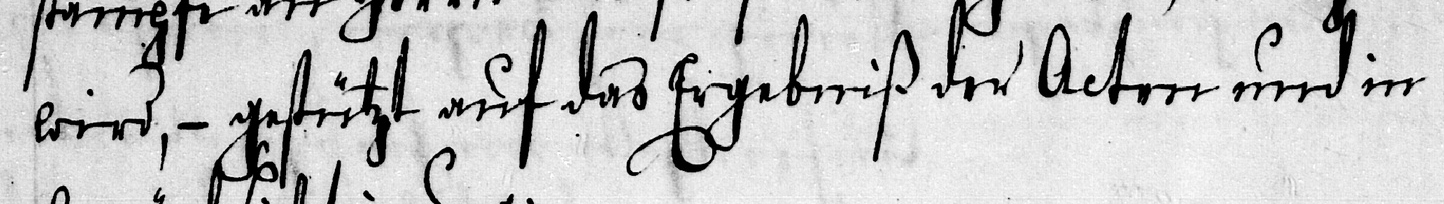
wird, – gestützt auf das Ergebniß der Acten und in
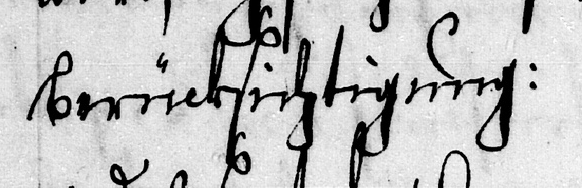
Berücksichtigung:
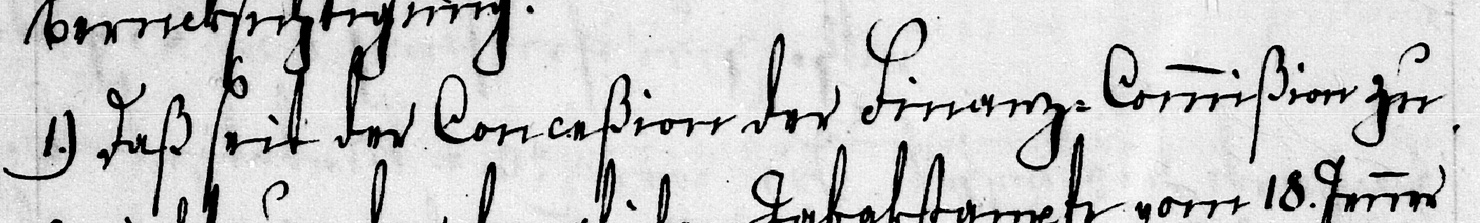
1.) Daß seit der Conceßion der Finanz-Commißion zu
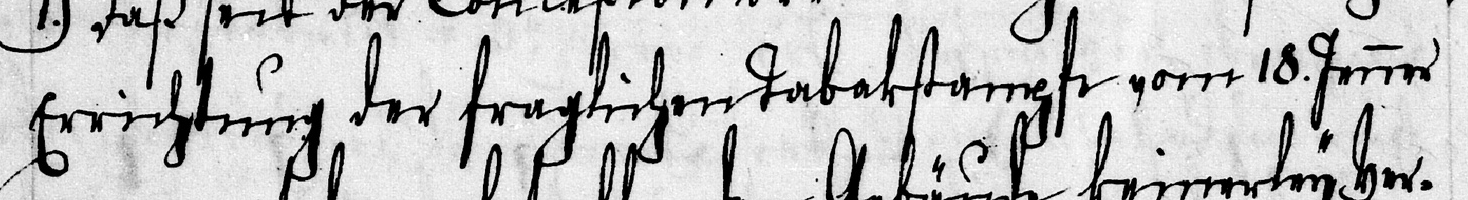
Errichtung der fraglichen Tabakstampfe vom 18. Jenner
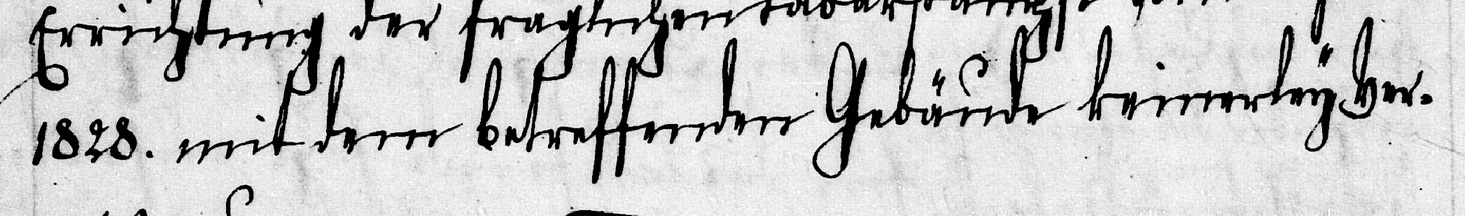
1828. mit dem betreffenden Gebäude keinerley Ver¬
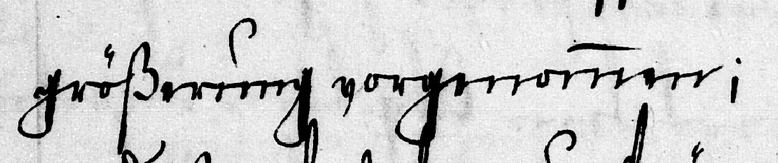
größerung vorgenommen;
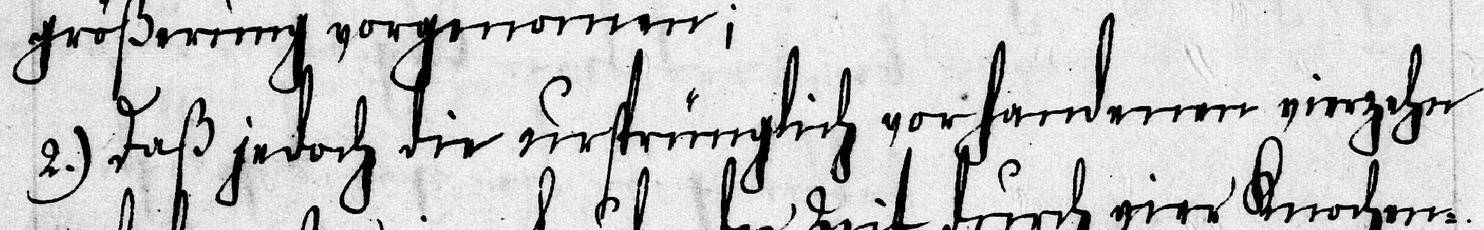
2.) Daß jedoch die ursprünglich vorhandenen vierzehn
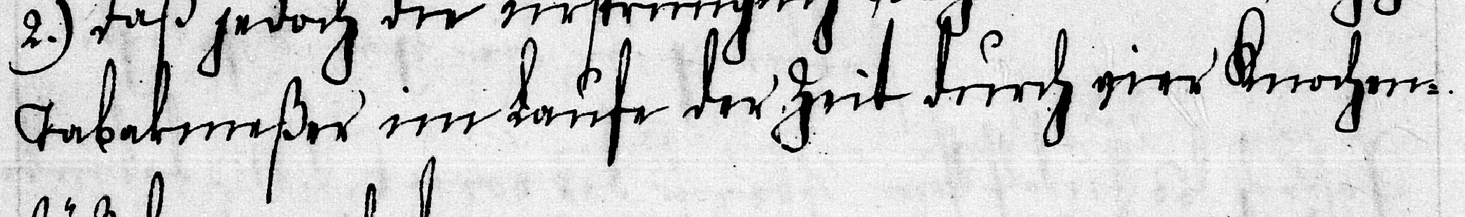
Tabakmeßer im Laufe der Zeit durch vier Knochen¬
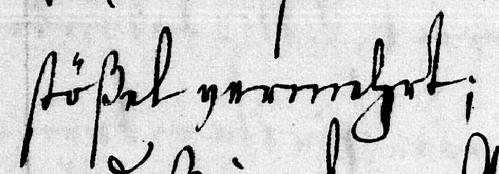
stößel vermehrt;
